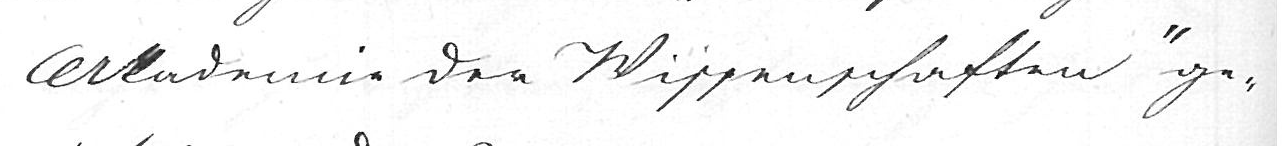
Akademie der Wissenschaften" ge-
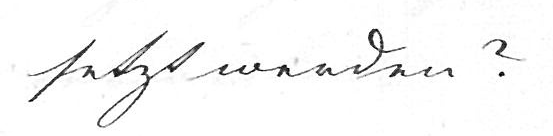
setzt werden?
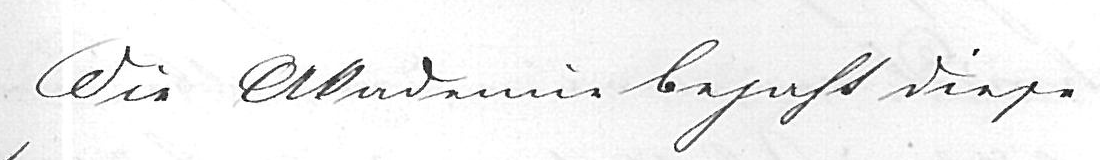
Die Akademie bejaht diese
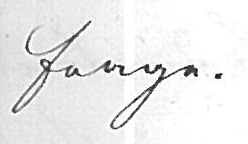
Frage.
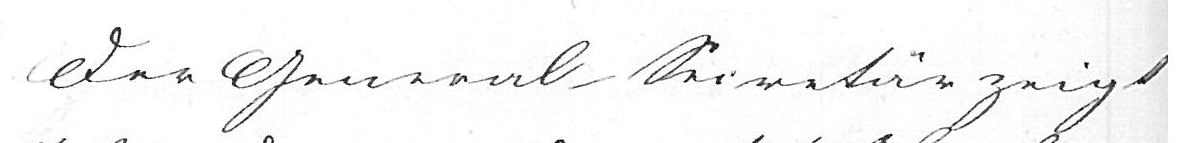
Der General-Secretär zeigt
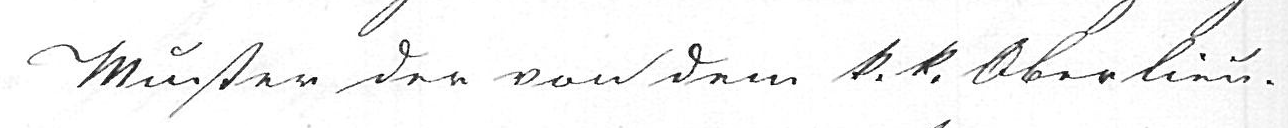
Muster der von dem k.k. Oberlieu-
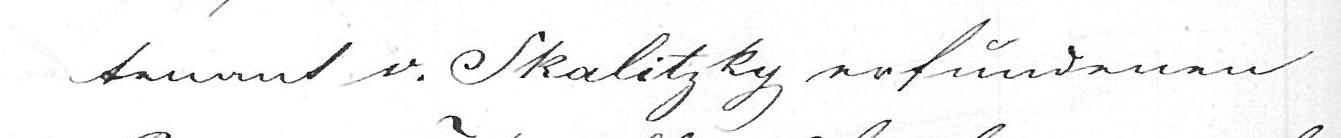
tenant v. Skalitzky erfundenen
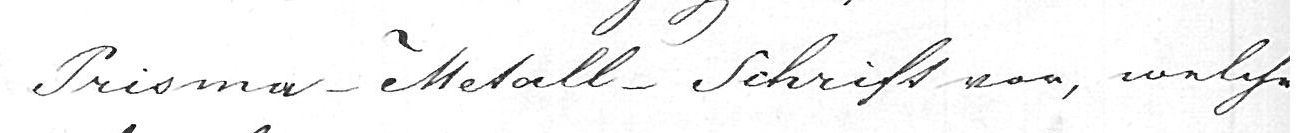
Prisma-Metall-Schrift vor, welche
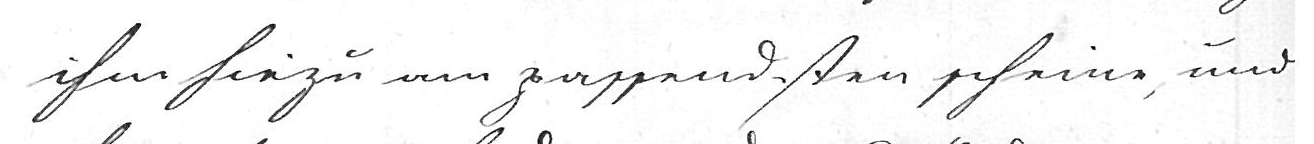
ihm hiezu am passendsten scheine und
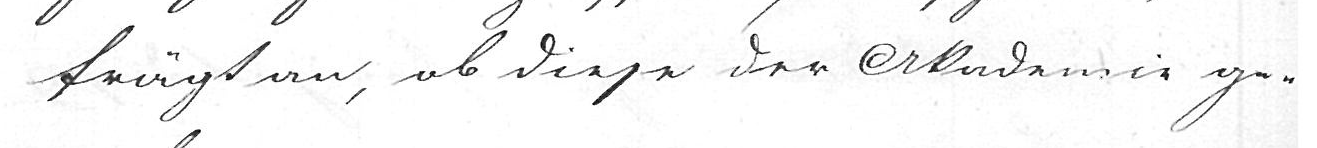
frägt an, ob diese der Akademie ge-
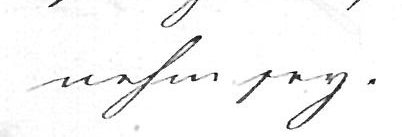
nahm sey.
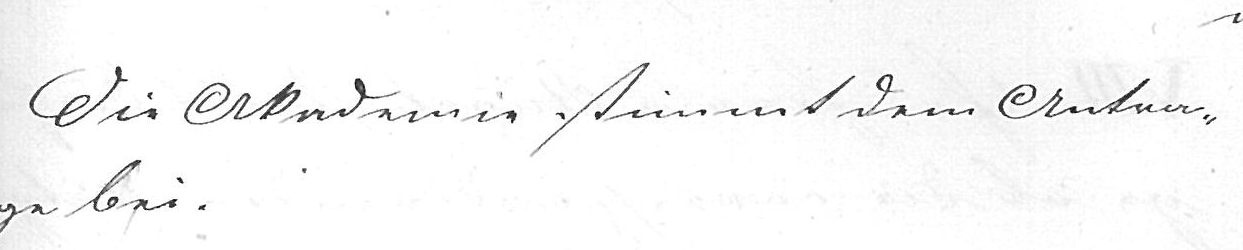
Die Akademie stimmt dem Antra-
